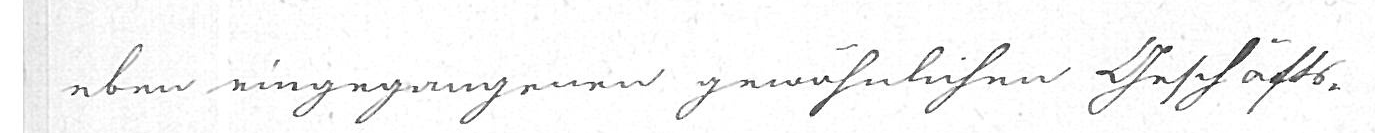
eben eingegangenen gewöhnlichen Geschäfts-
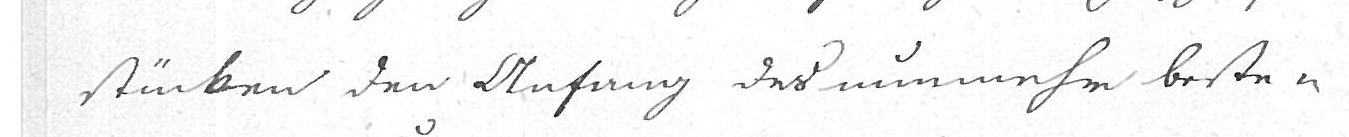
stücken den Anfang des nunmehr beste-
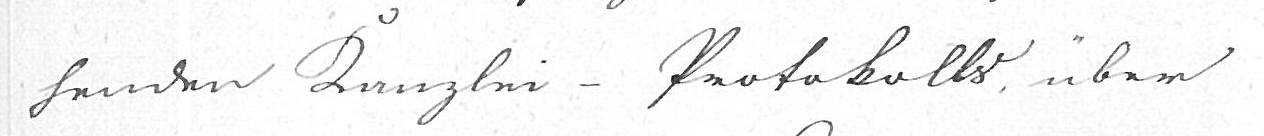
henden Kanzlei-Protokolls, über
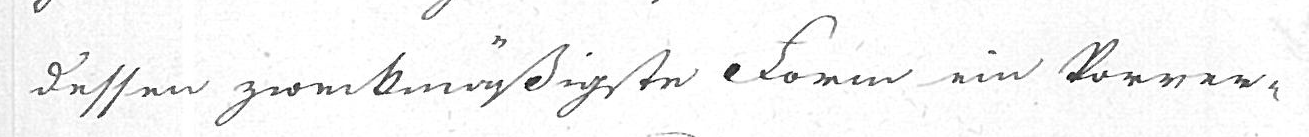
dessen zweckmäßigste Form ein Vorver-
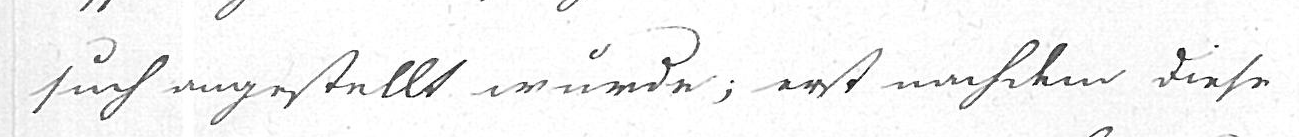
such angestellt wurde; erst nachdem dieser
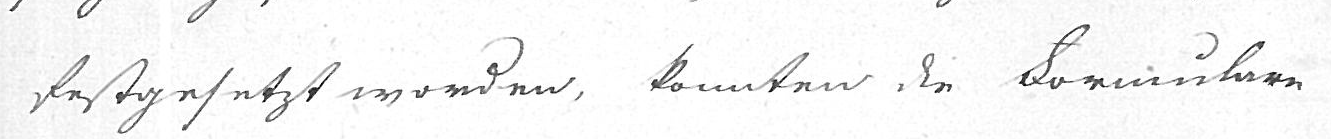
festgesetzt worden, konnten die Formulare
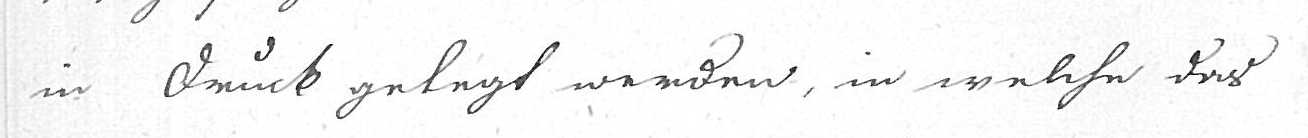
in Druck gelegt werden, in welcher das
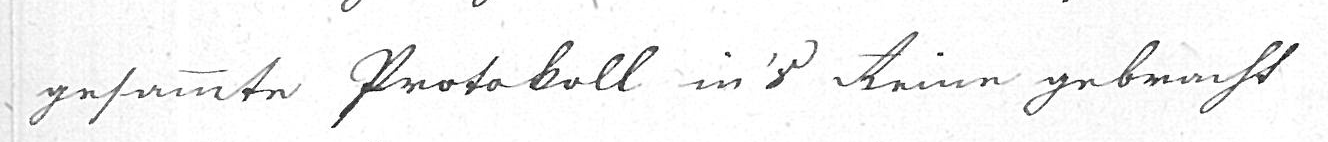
gesammt Protokoll in's Reine gebracht
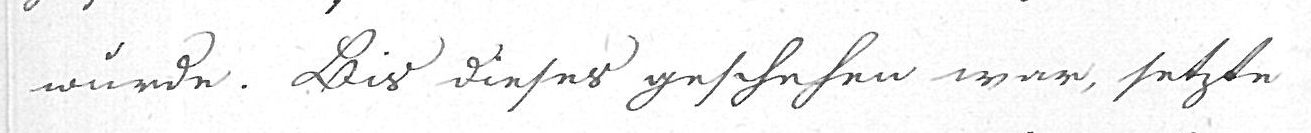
wurde. Bis dieses geschehen war, setzte
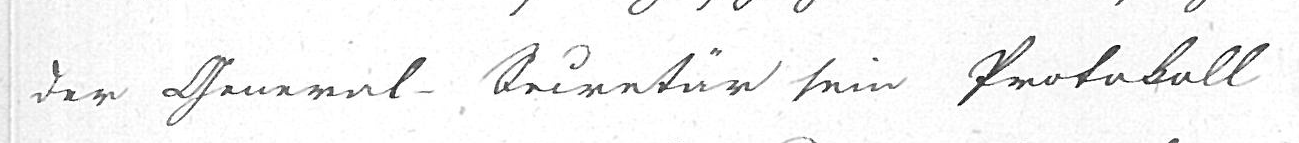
der General-Secretär sein Protokoll
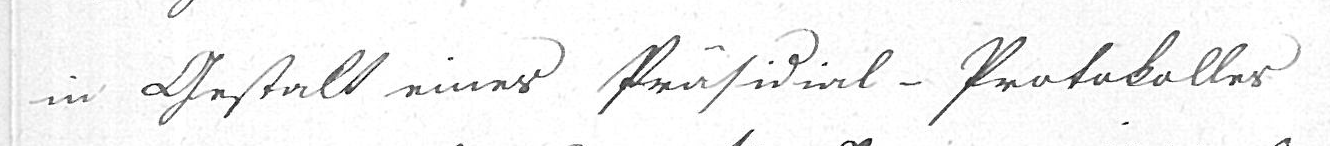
in Gestalt eines Präsidial-Protokolles
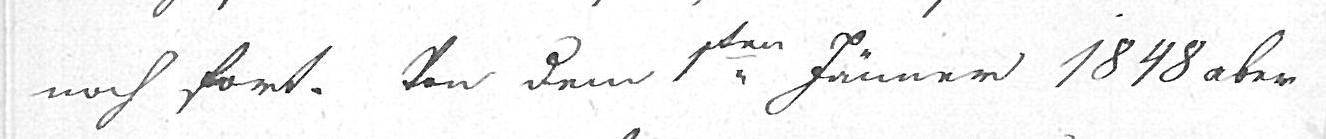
noch fort. Von dem 1ten Jänner 1848 aber
